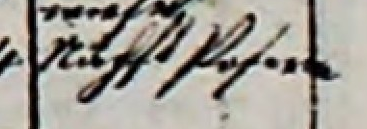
Nächst Posern
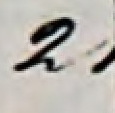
2
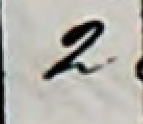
2
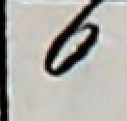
6
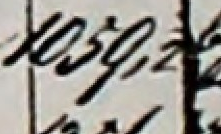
1059,2
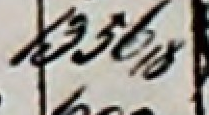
1356,8
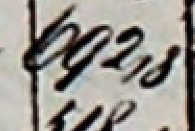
692,8
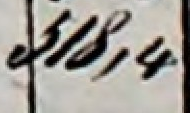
518,4
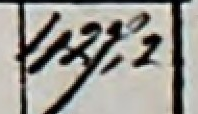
1127,2
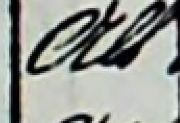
Alt
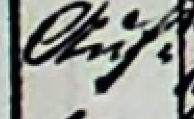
Aus„
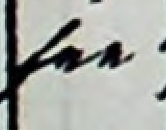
see
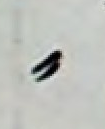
„
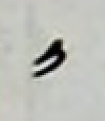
„
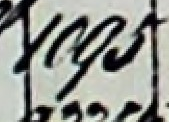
1095
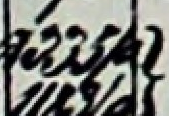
1335/a
